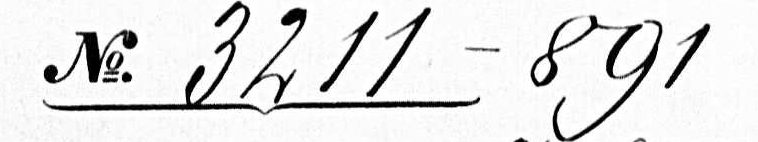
No. 3211 – 891
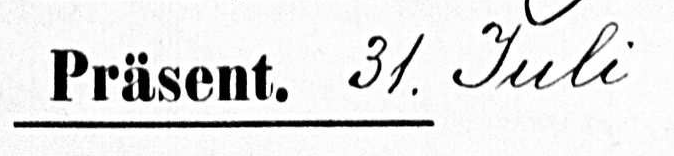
Präsent. 31. Juli
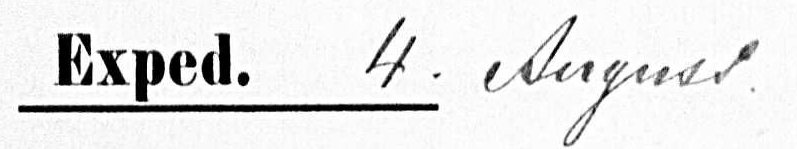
Exped. 4. August.
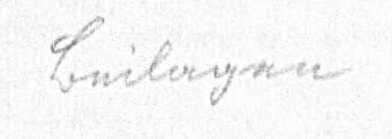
Beilagen
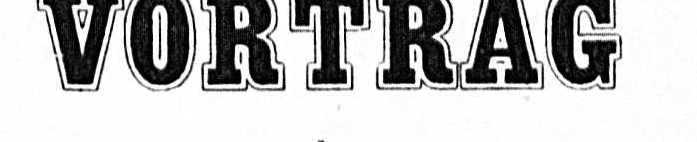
VORTRAG
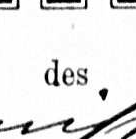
des
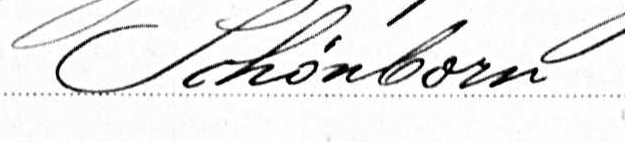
Schönborn
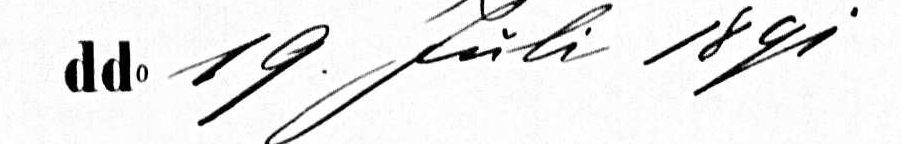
ddo 19. Juli 1891
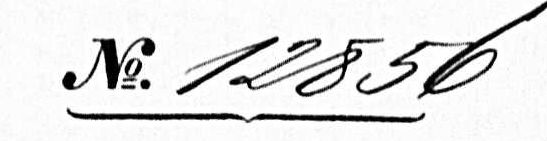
No. 12856
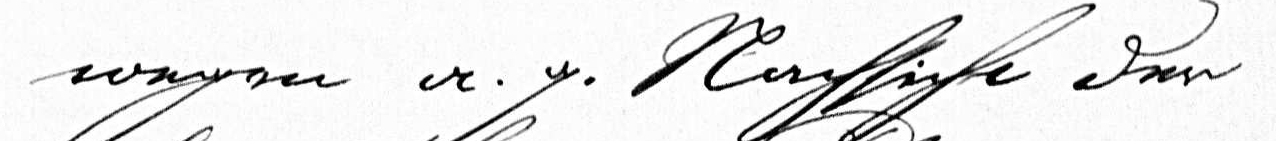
wegen a. g. Nachsicht der
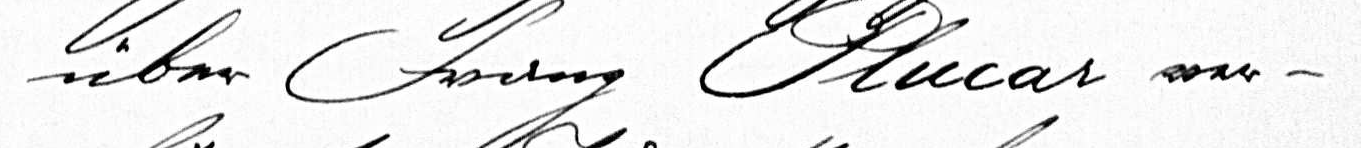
über Franz Plucar ver¬
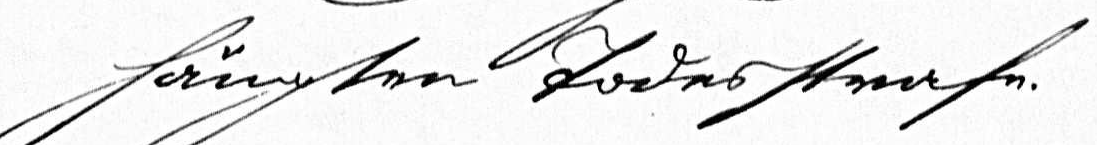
hängten Todesstrafe.
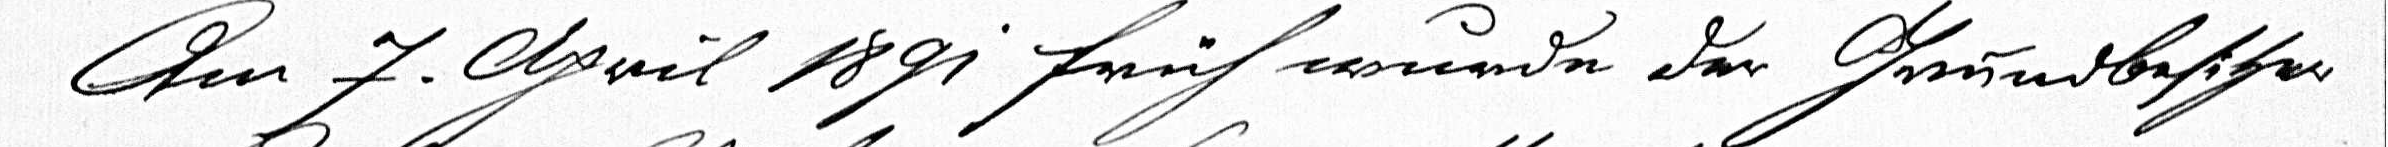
Am 7. April 1891 früh wurde der Grundbesitzer
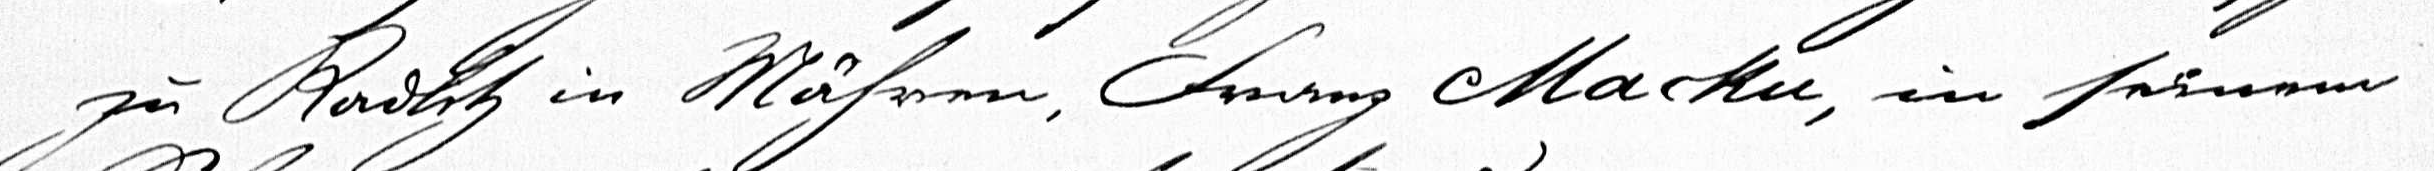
zu Radlitz in Mähren, Franz Macku, in seinem
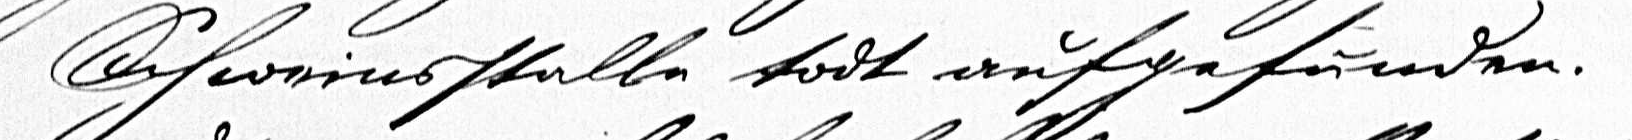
Schweinsstelle todt aufgefunden.
